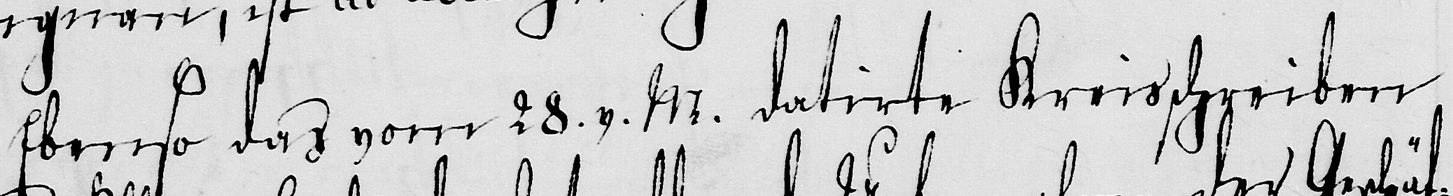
Ebenso das vom 28. v. M. datirte Kreisschreiben
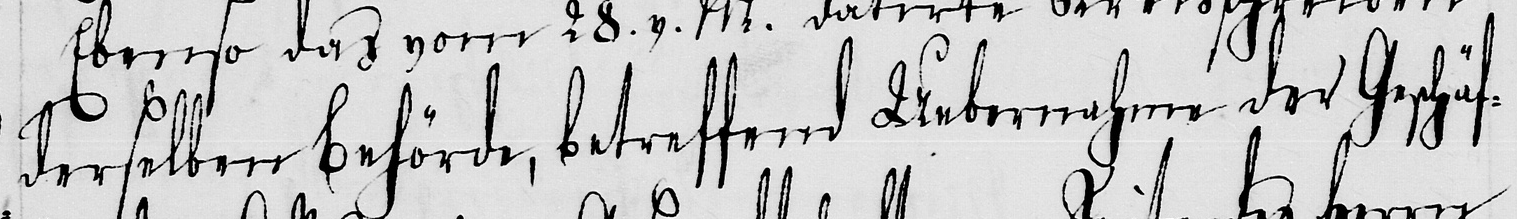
derselben Behörde, betreffend Uebernahme der Geschä¬
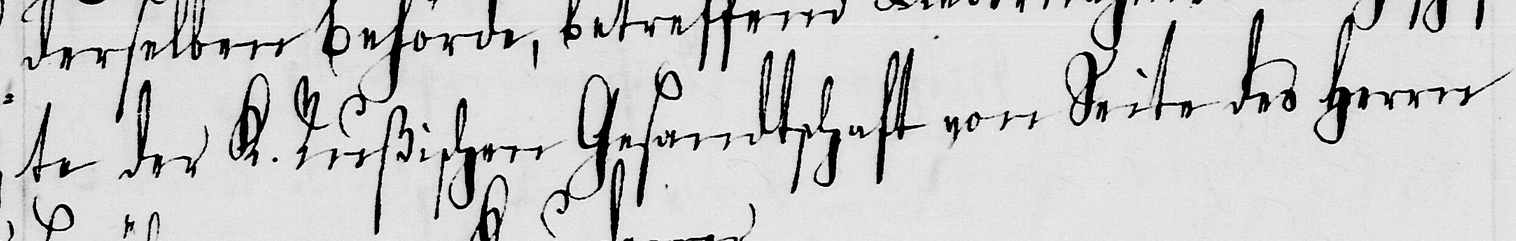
fte der K. Rußischen Gesandtschaft von Seite des Herrn
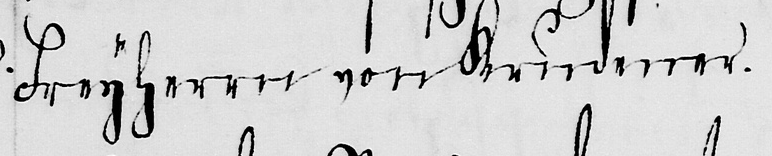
Freyherrn von Krudener.
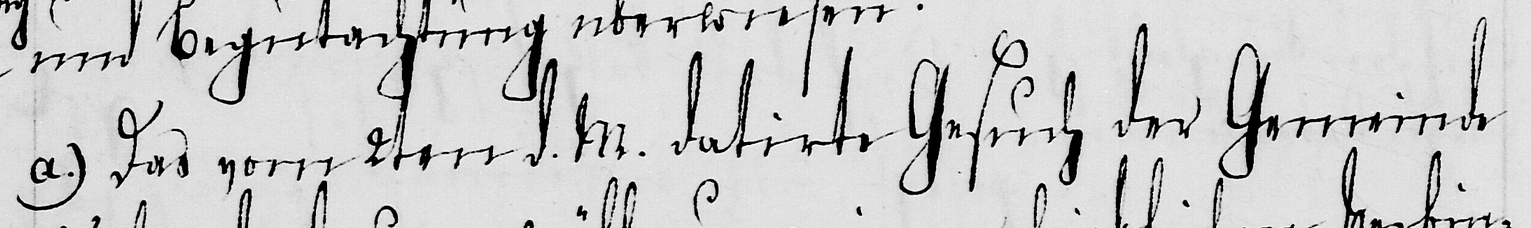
a.) Das vom 2ten d. M. datirte Gesuch der Gemeinde
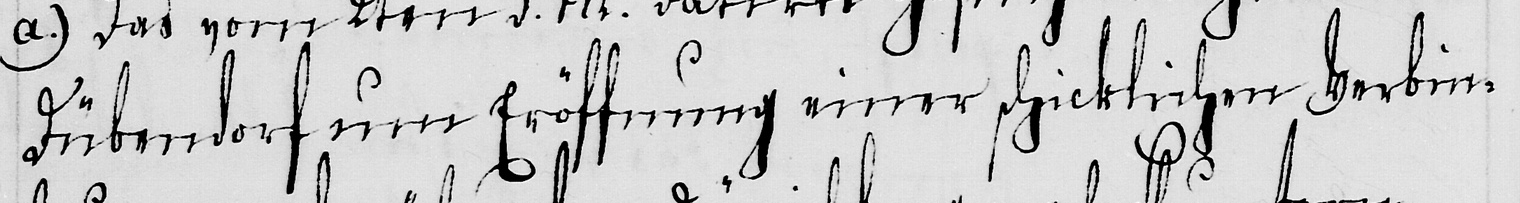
Dübendorf um Eröffnung einer schicklichen Verbin¬
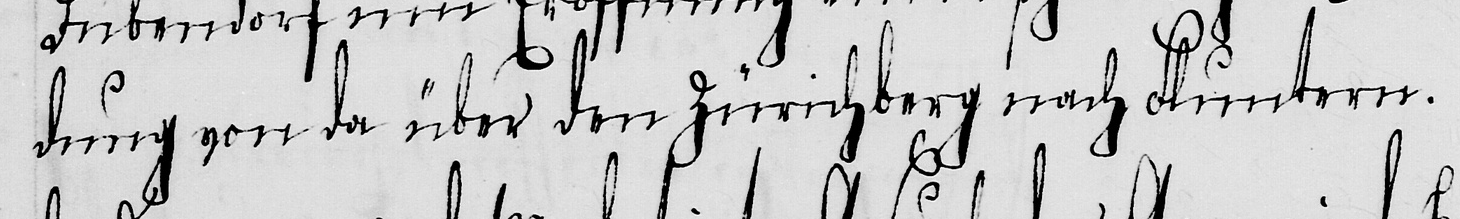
dung von da über den Zürichberg nach Fluntern.
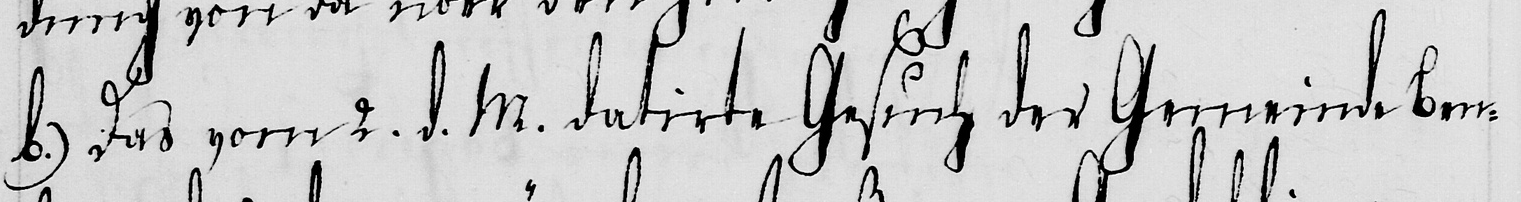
b.) Das vom 2. d. M. datirte Gesuch der Gemeinde Ben¬
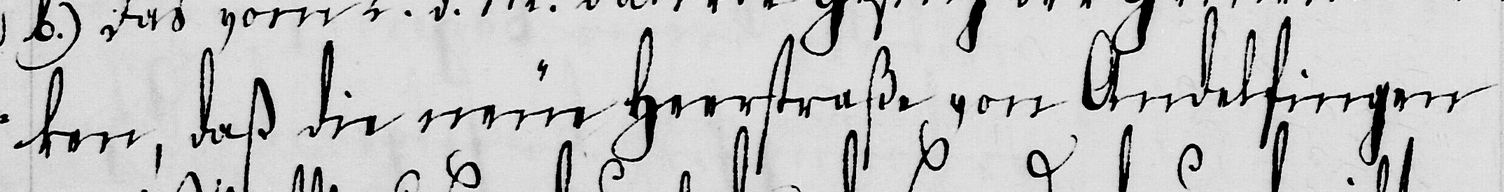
ken, daß die neue Heerstraße von Andelfingen
